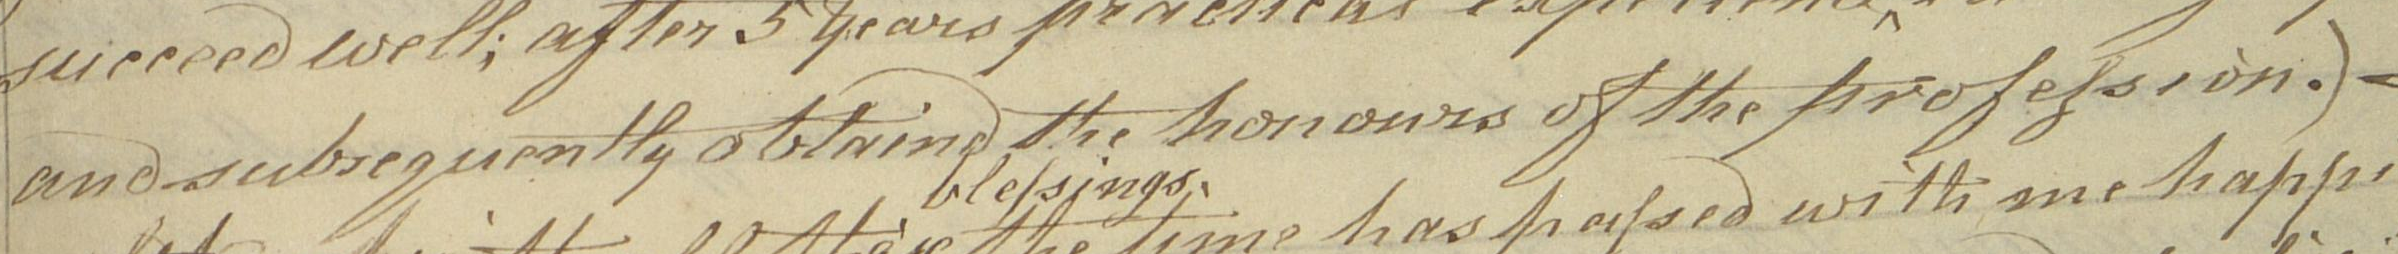and subsequently obtaind the honours of the profession.)
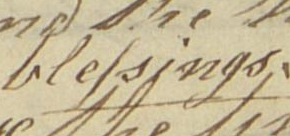blessings
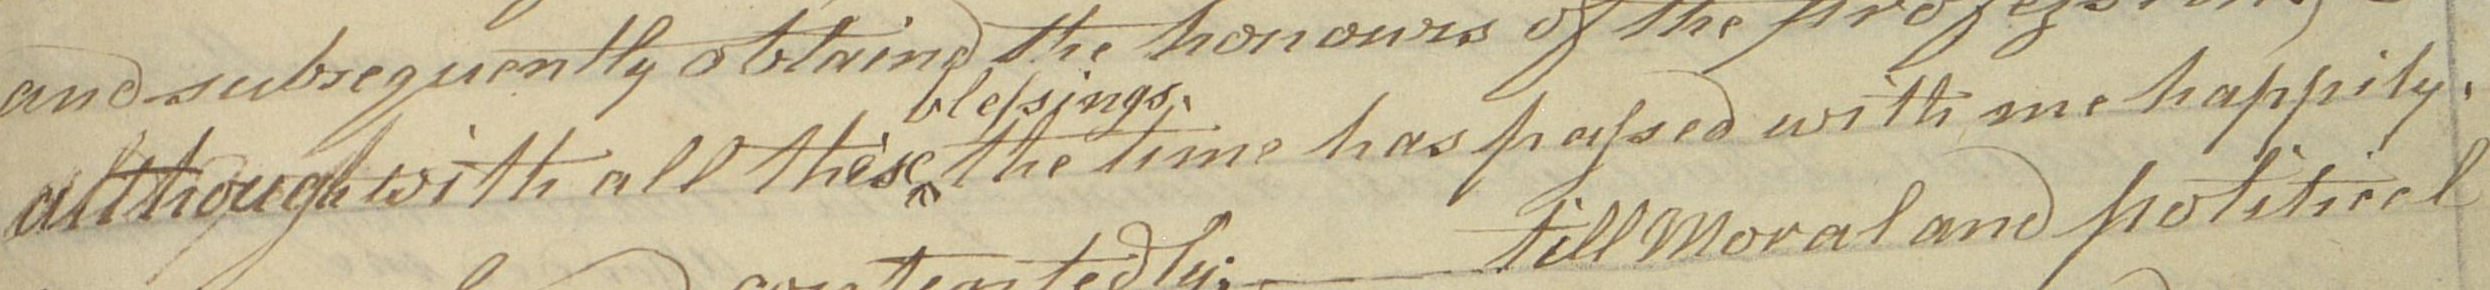although with all these ^ the time has passed with me happily,
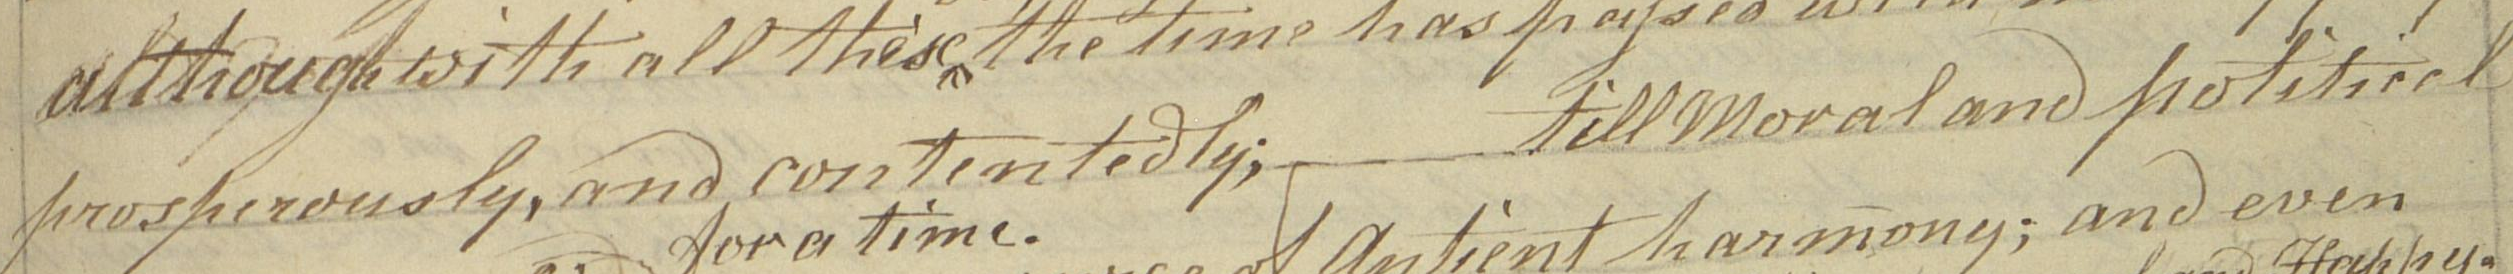prosperously, and, contentedly; till Moral and political
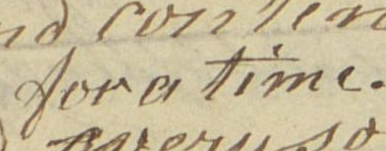for a time
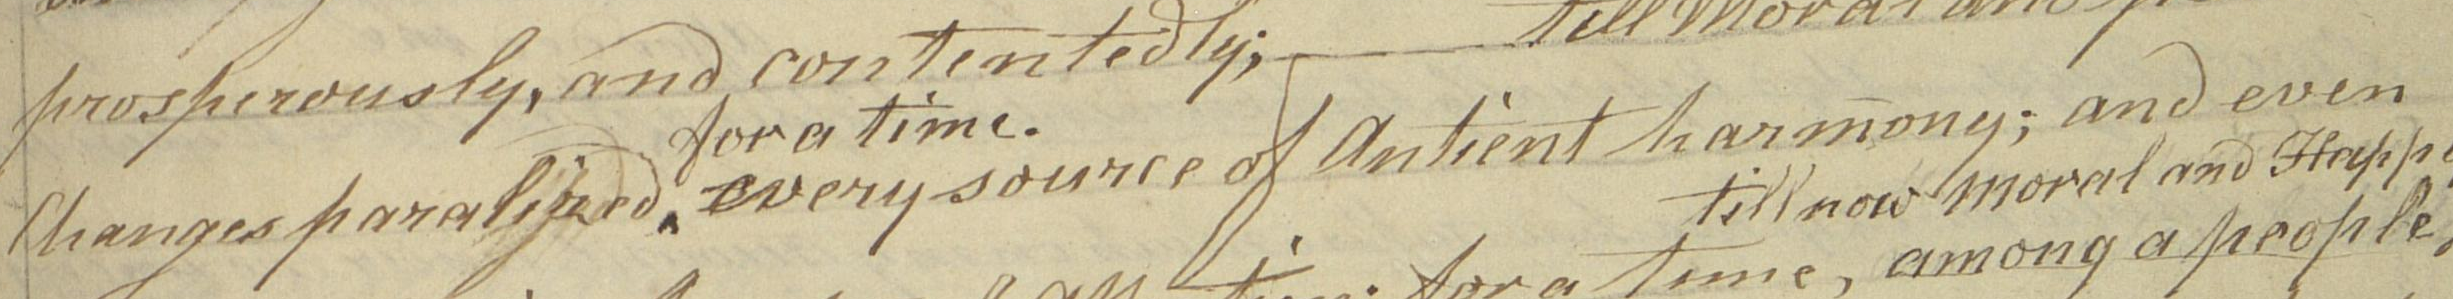Changes paralized ^ every source of Antient harmony; and even
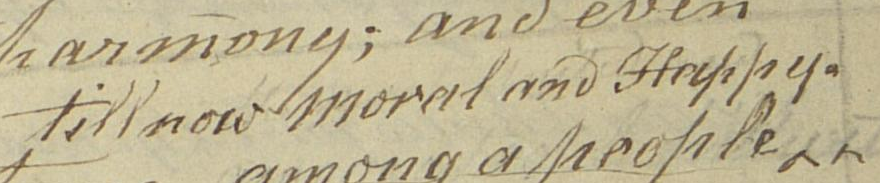till now moral and Happy.
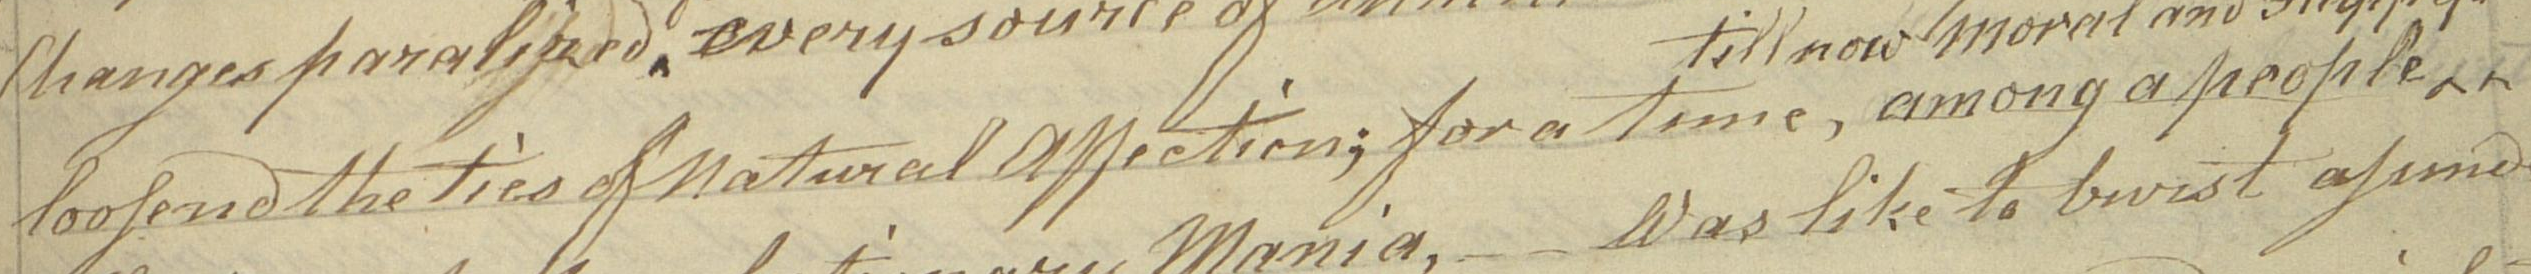loosend the ties of Natural Affection; for a time, among a people ^ ^
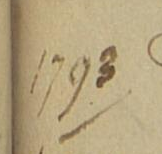1793
